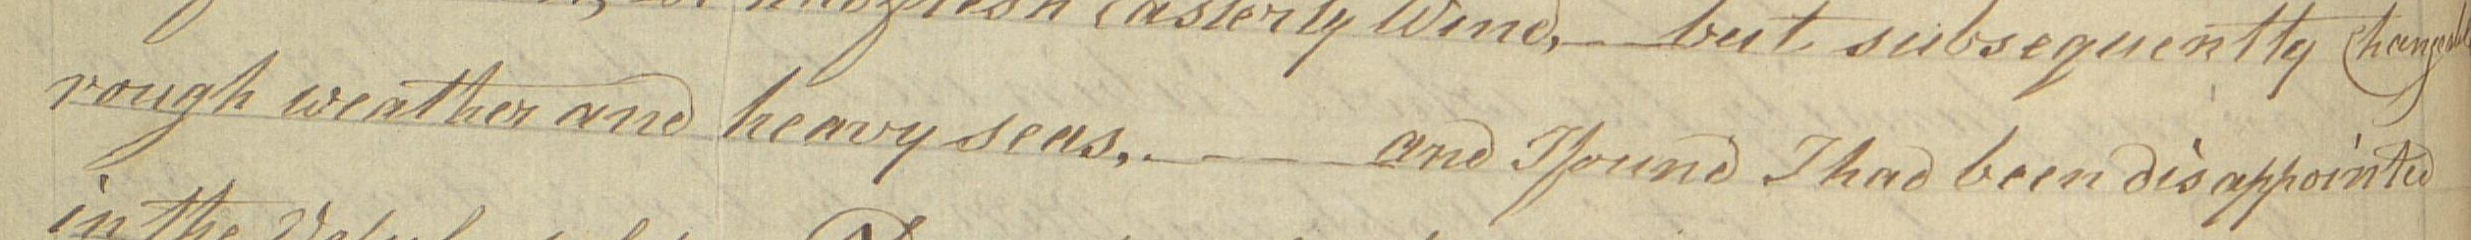rough weather and heavy seas. and I found I had been disappointed
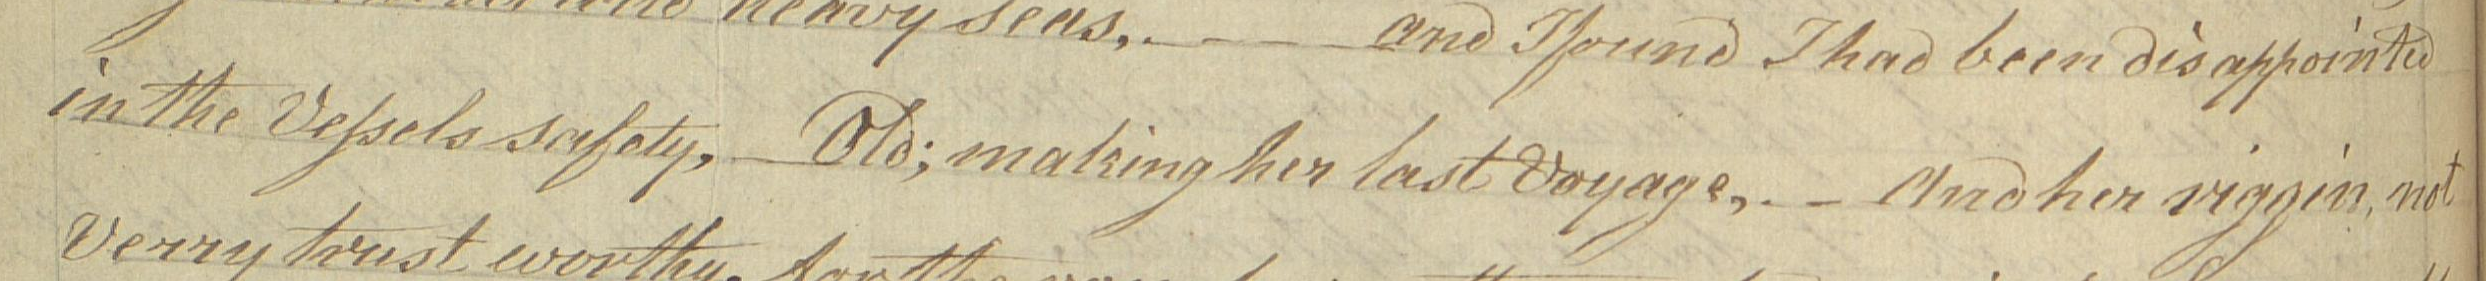in the Vessels safety. Old; making her last Voyage. And her riggin, not
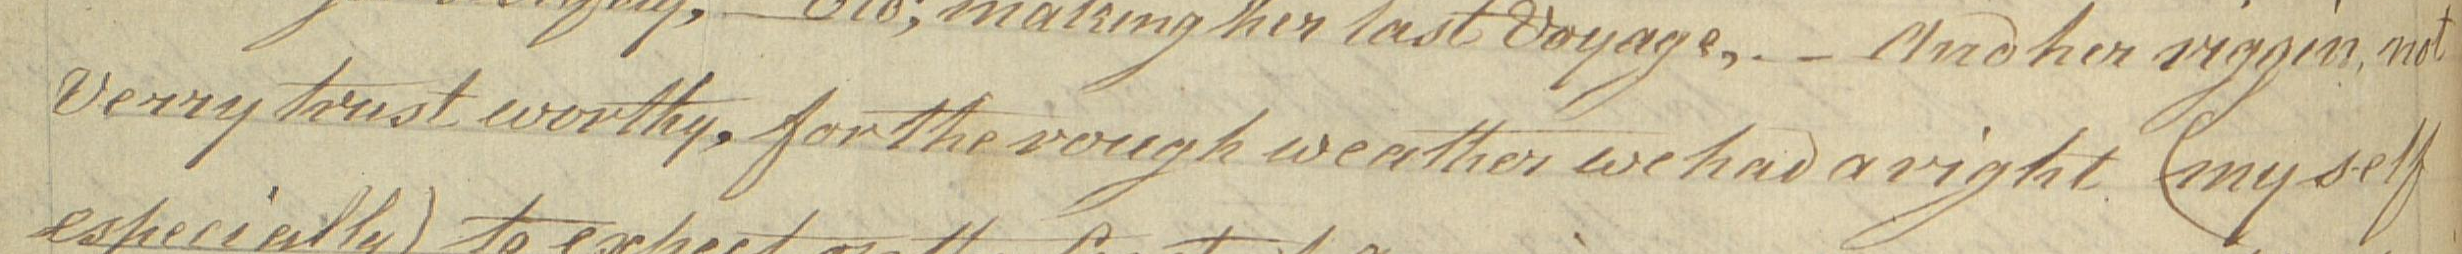verry trust worthy, for the rough weather we had a right (my self
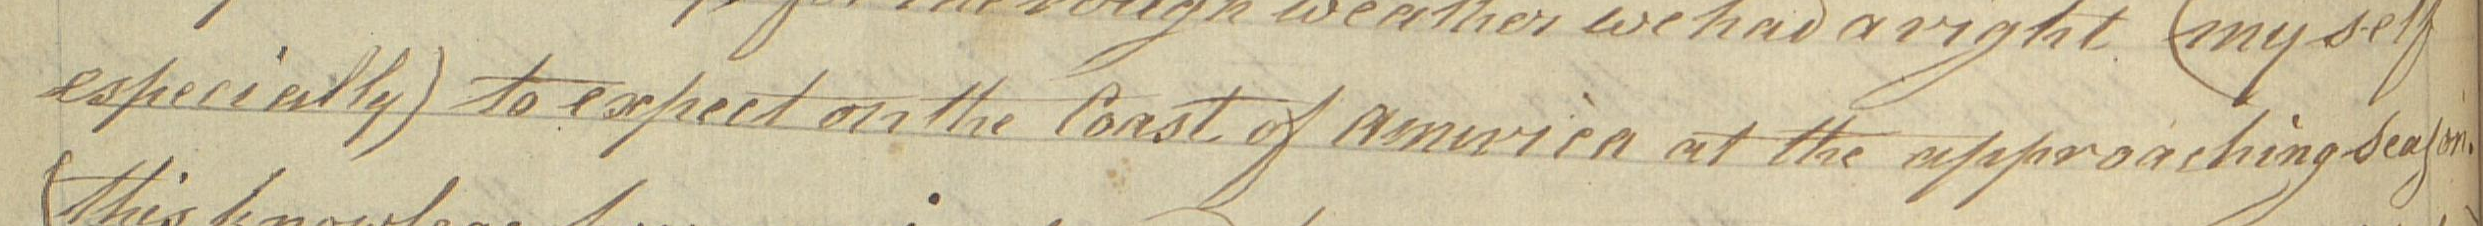especially) to expect on the Coast of America at the approaching season.
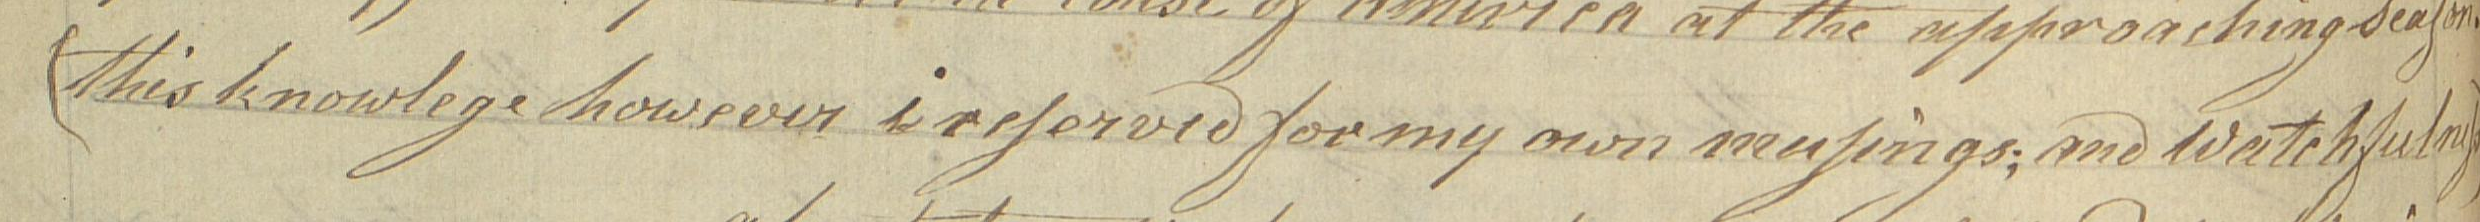(this knowlege however i reserved for my own musings; and Watchfulness)
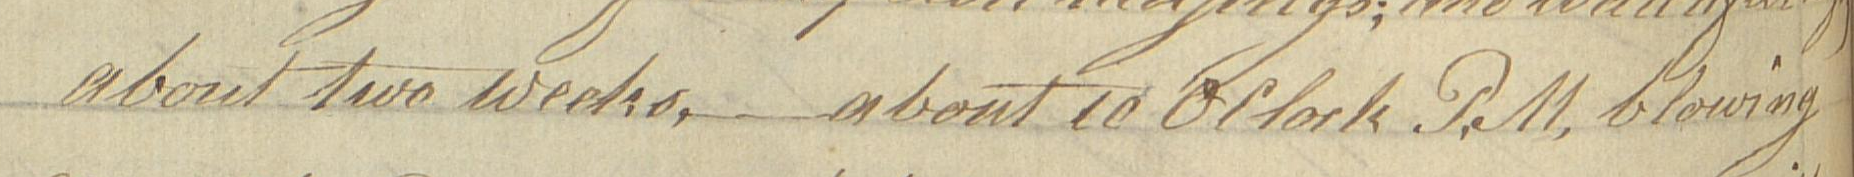about two Weeks, about 10 OClock PM. blowing
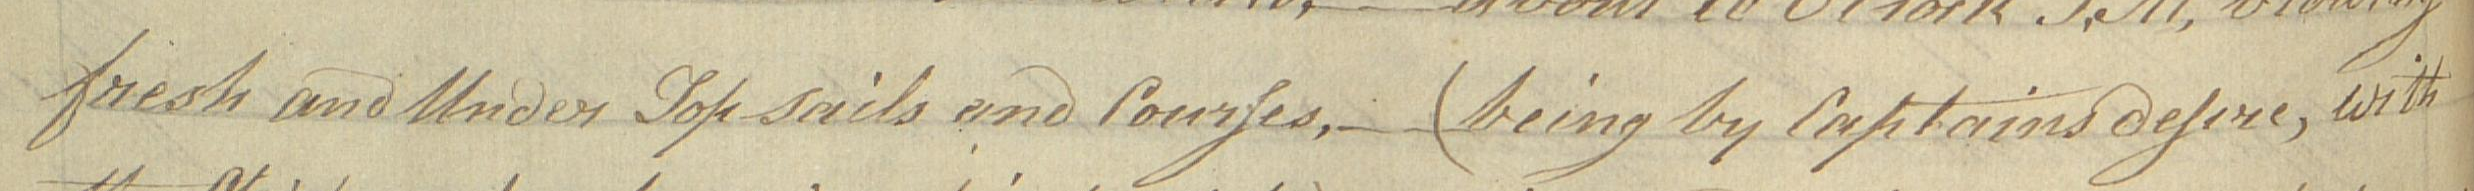fresh and Under Top sails and Courses, (being by Captains desire, with
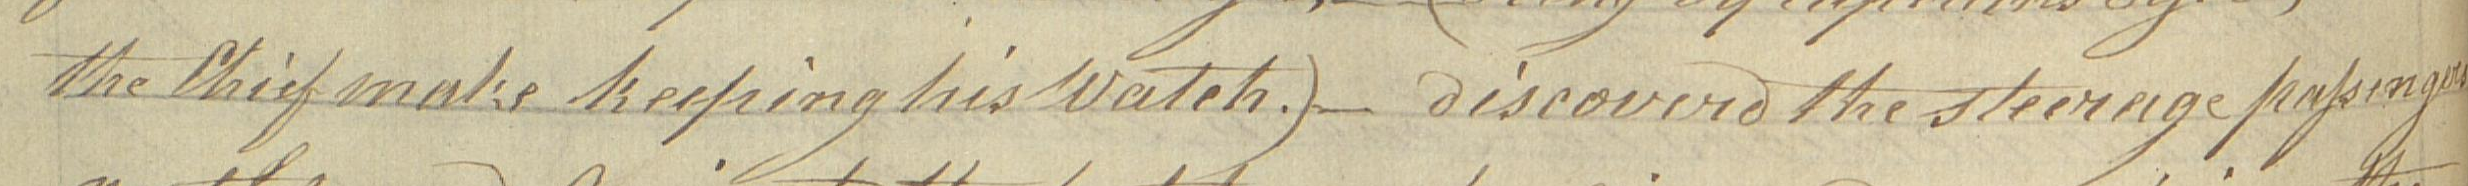the Chief mate keeping his Watch.) discoverd the steerage passing
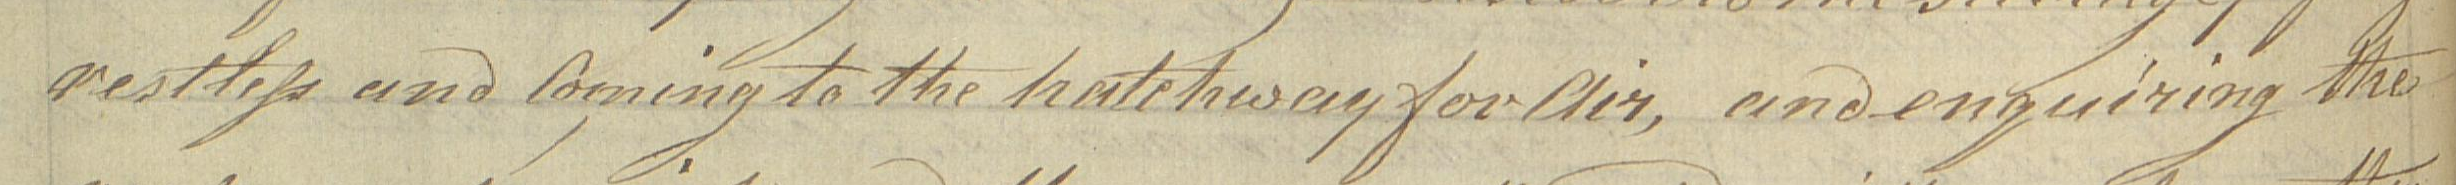restless and Coming to the hatchway for Air, and enquiring the
